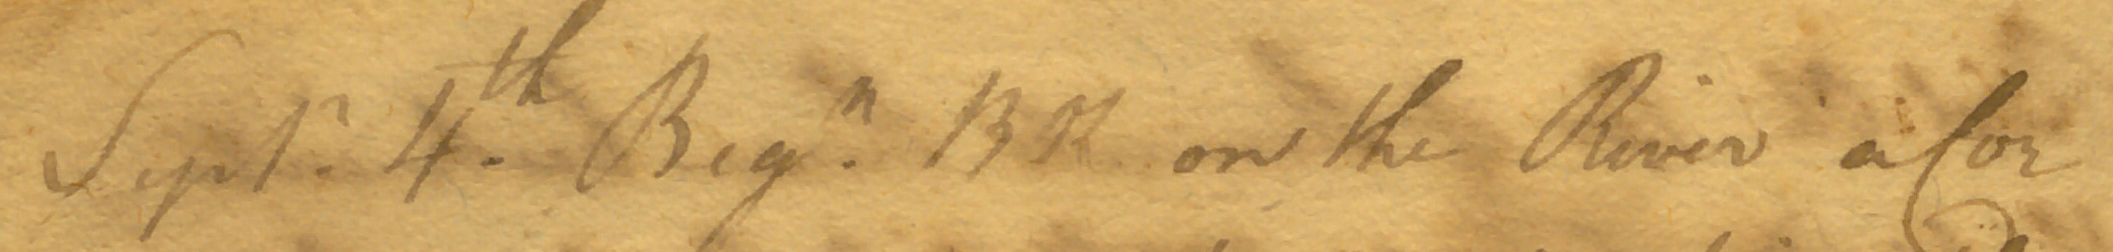Sept^r. 4^th. Beg^n. B 0h on the River a Cor
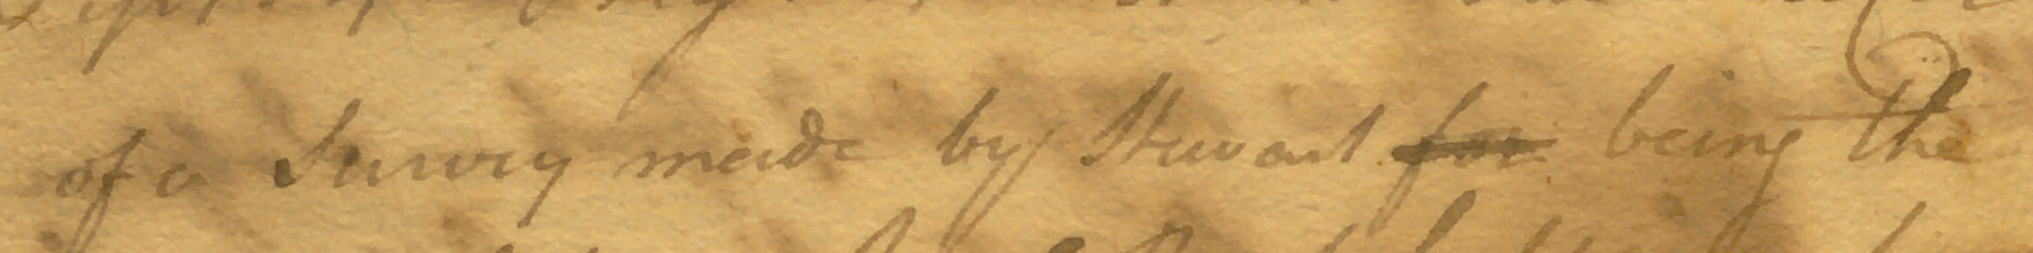of a Survey made by Stewart being the
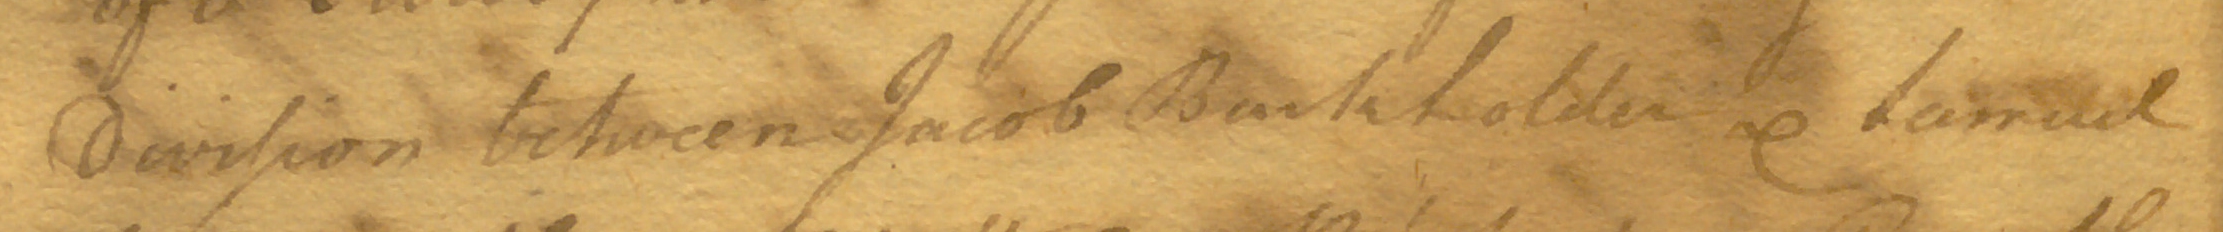division between Jacob Barkholder & Samuel
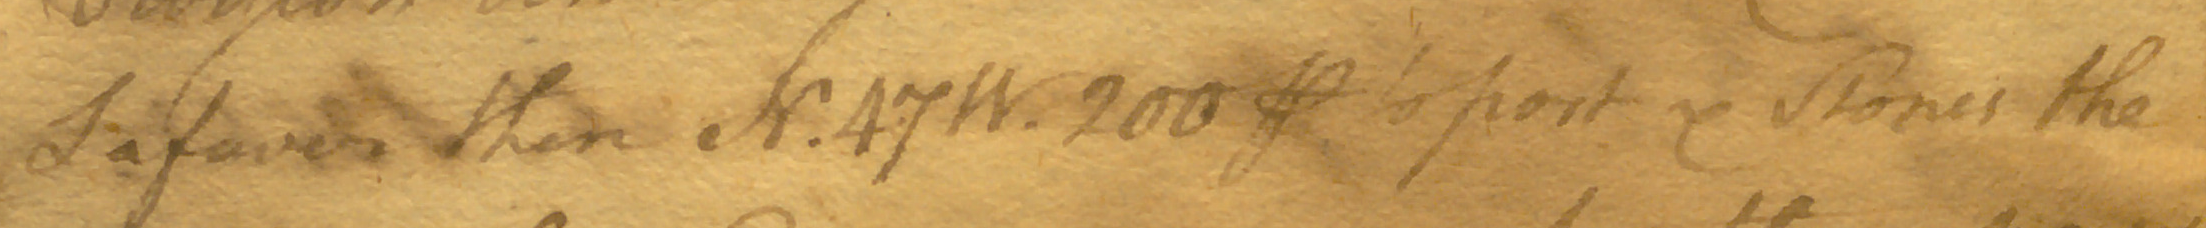Lafaver then N.57W. 200 per to port & the
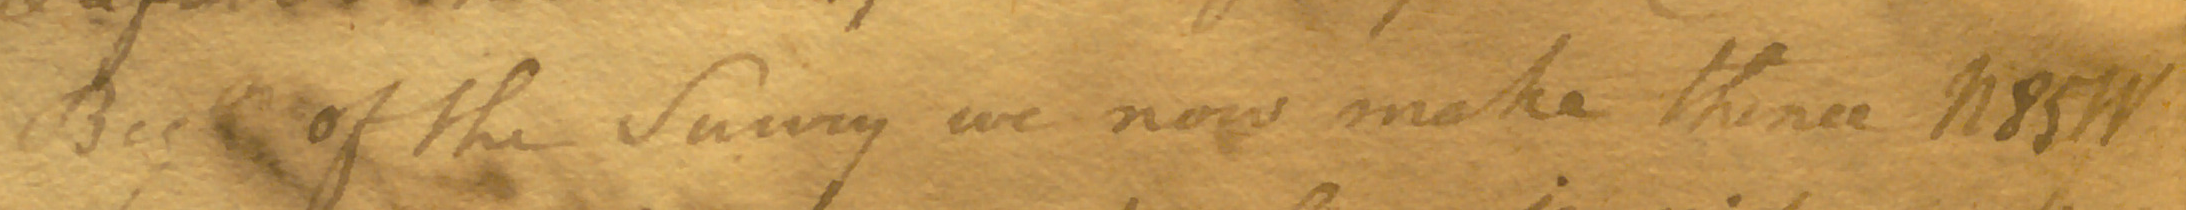Bes of the Survey we now make thence N85W
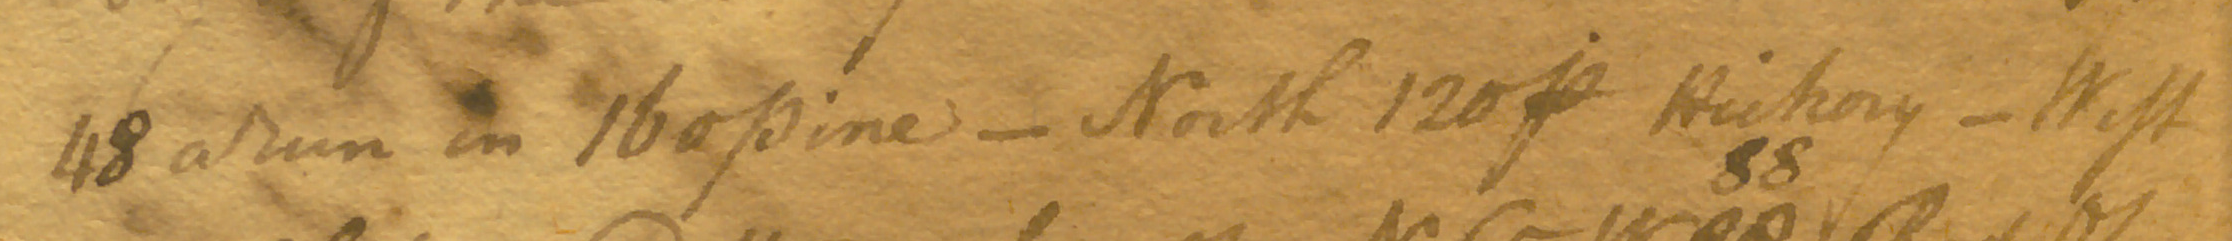48 a run in 16 a pine- North 120 per Hickory- West
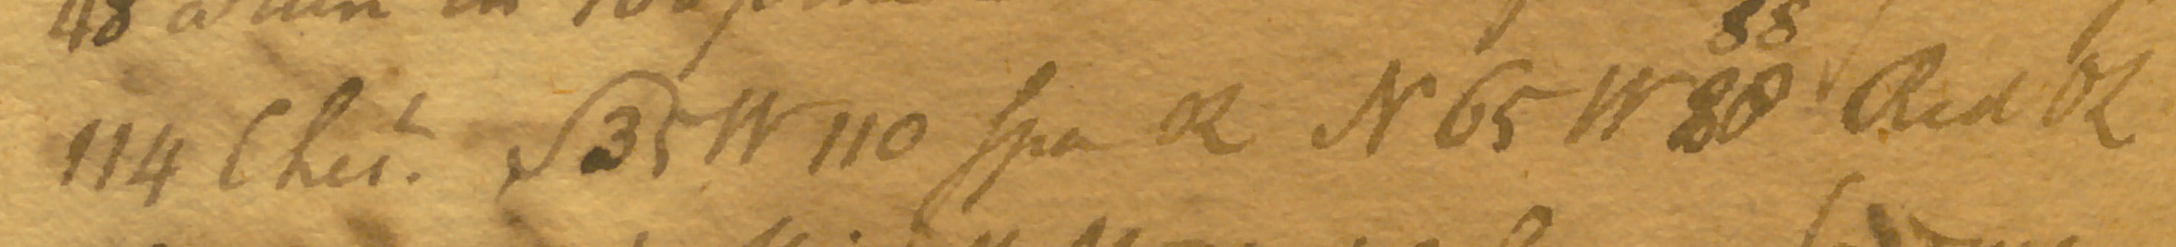114 Ches^t. S35W 110 Spa R N65W ^88 Red 0h
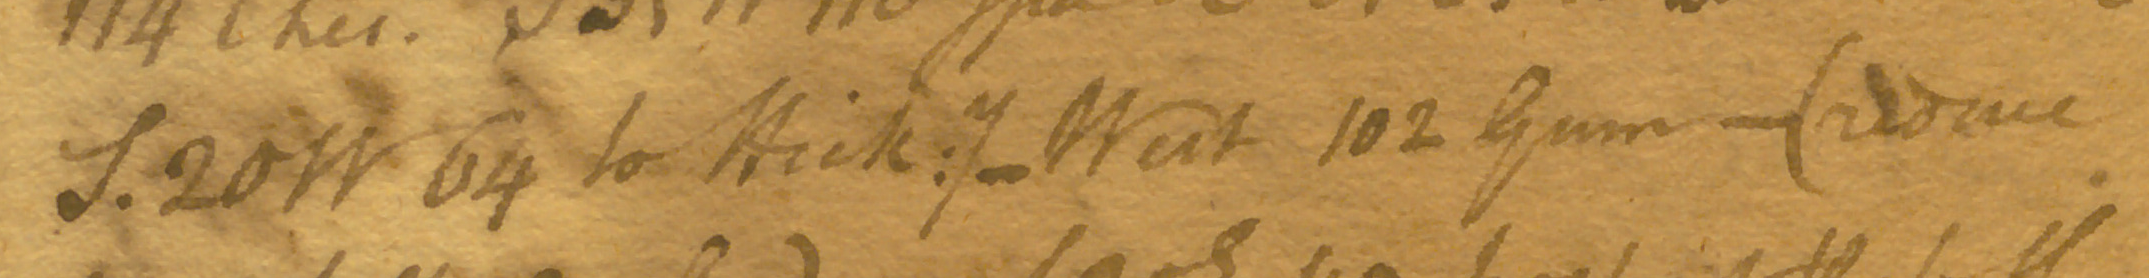S. 20W 64 to Hick:y- West 102 Gum- (reduce
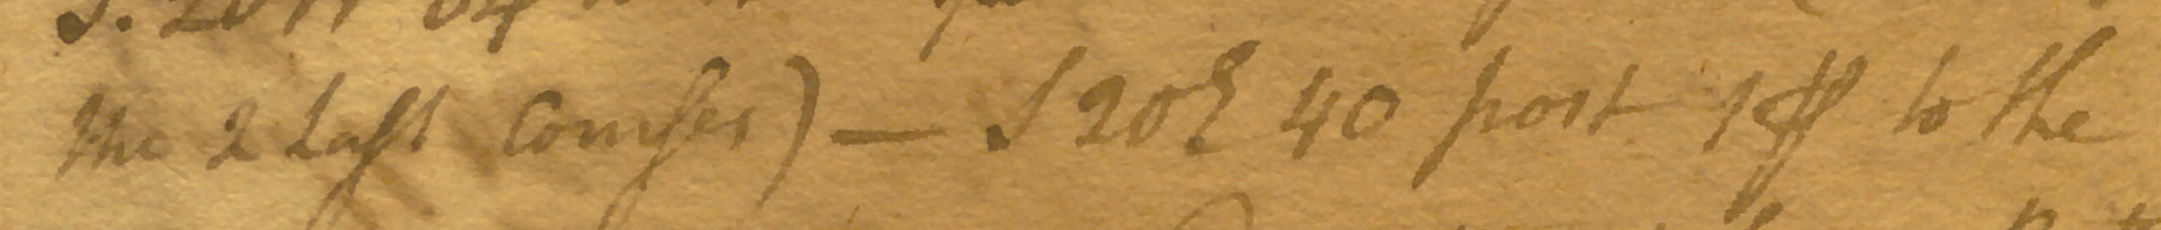the 2 last Courses)- S20E40 port 1 per to the
